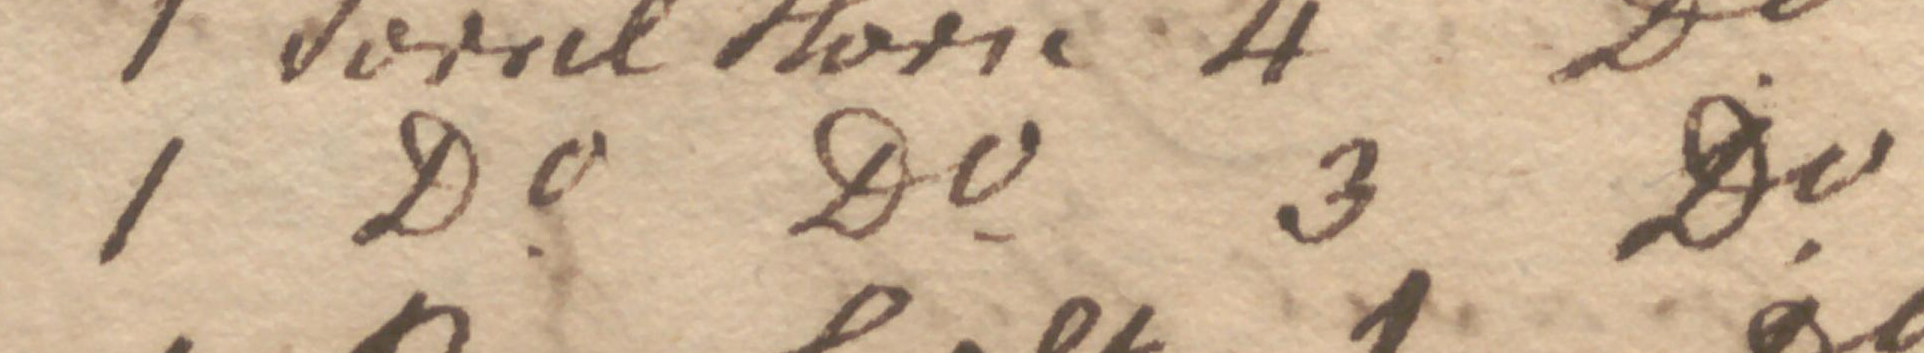1 D^o. D^o. 3 D^o.
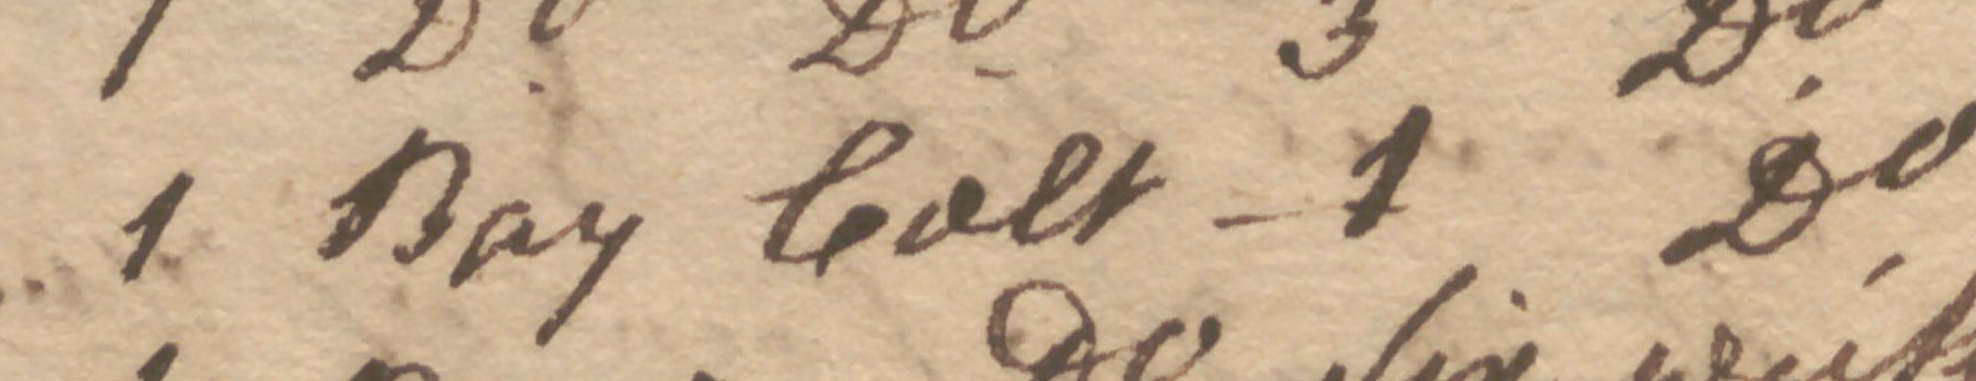1 Bay Colt 1 D^o.
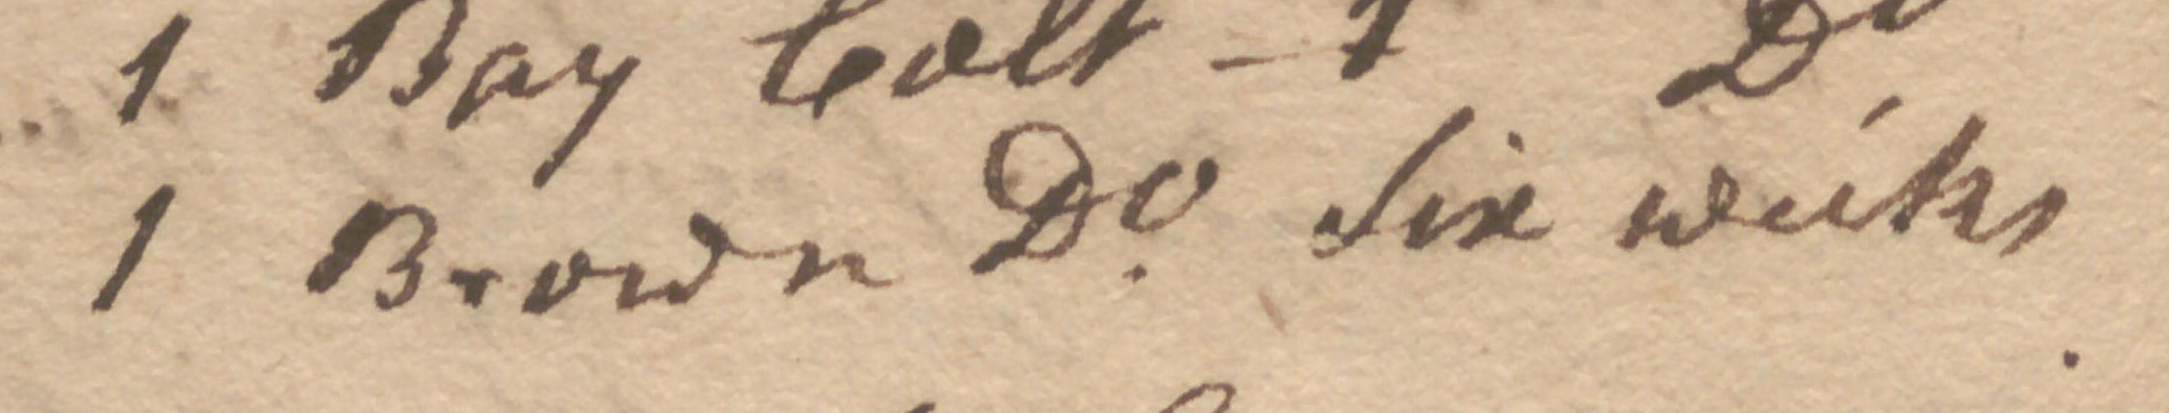1 Brown D^o. six weeks
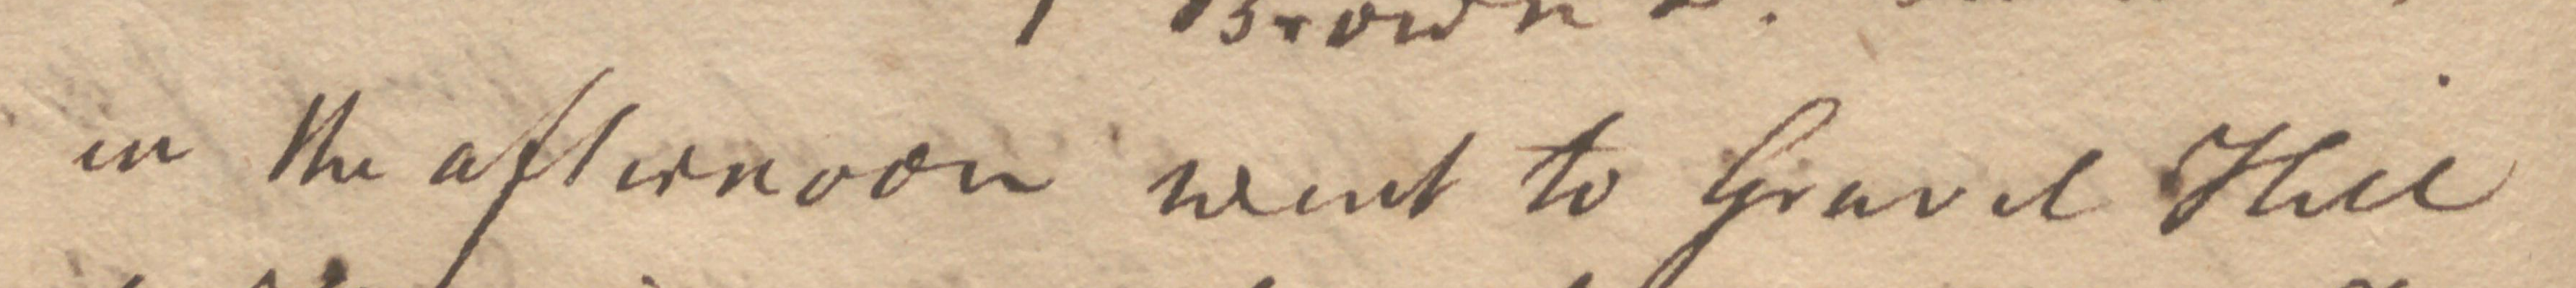in the afternoon went to Gravel Hill
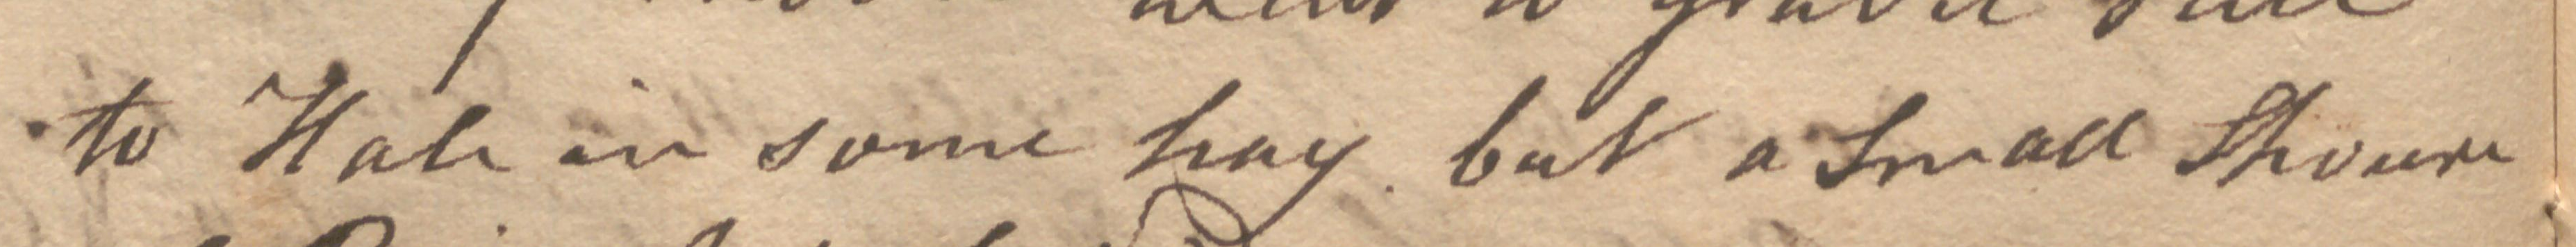to Hale in some hay but a small Shoure
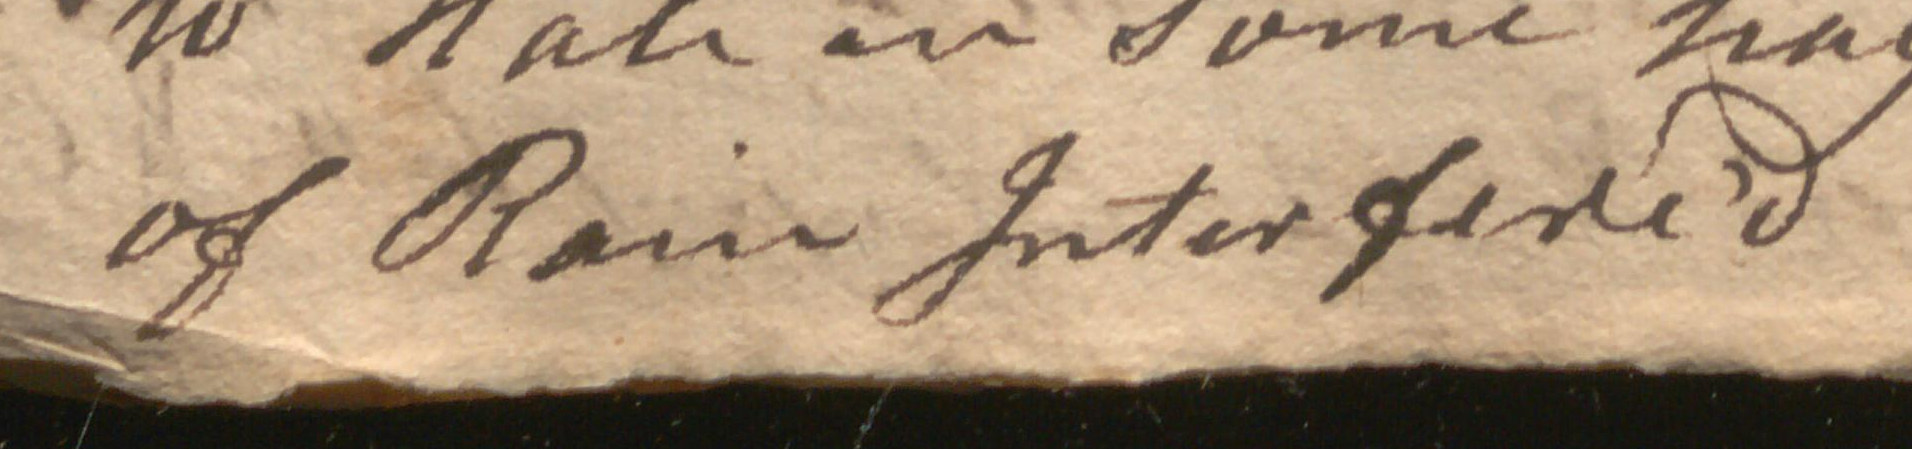of Rain Interfered
